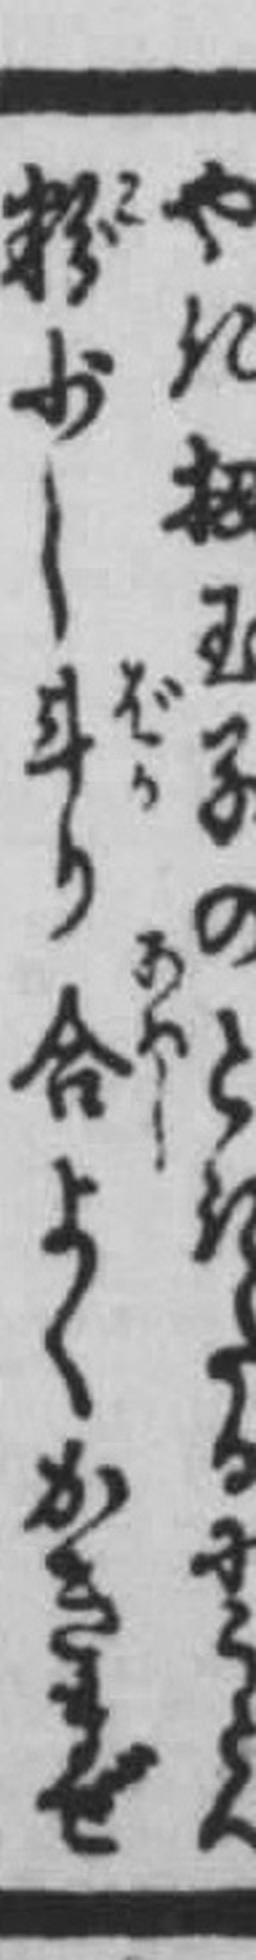粉少し斗り合よくかきまぜ
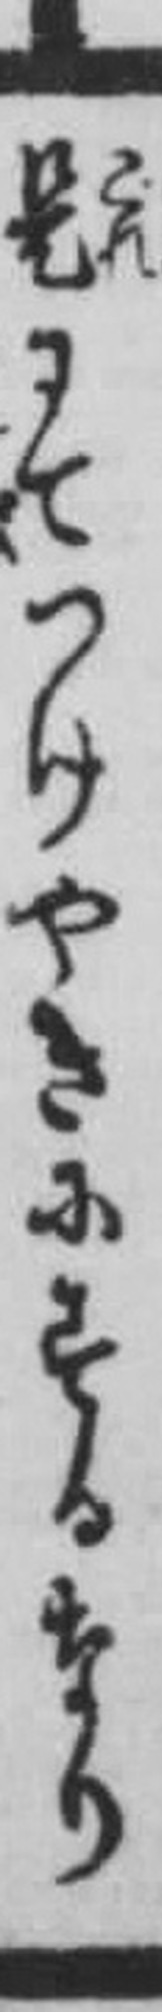是にてつけやきにするなり
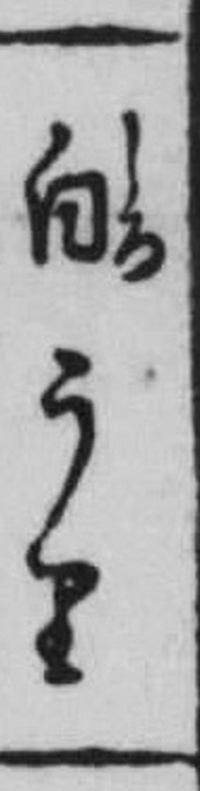白うり
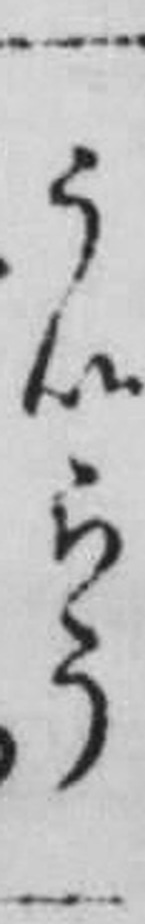ういらう
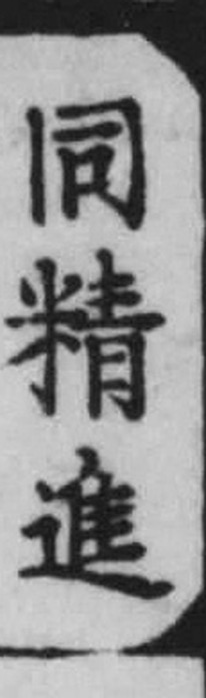同精進
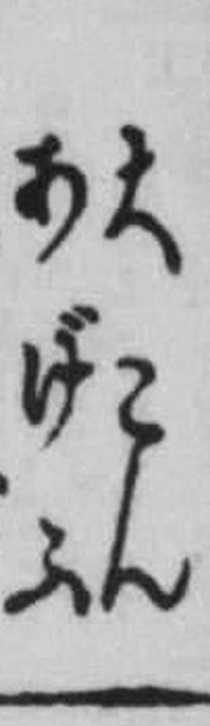あげふ
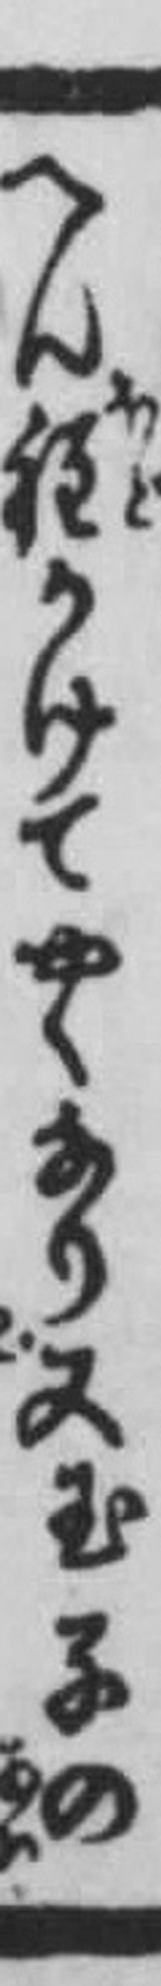へん程かけてやくなり又玉子の
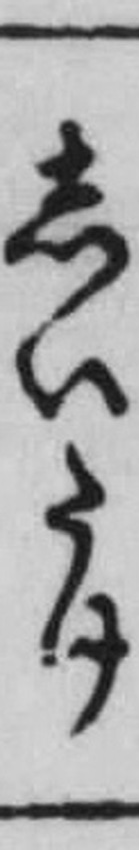しいたけ
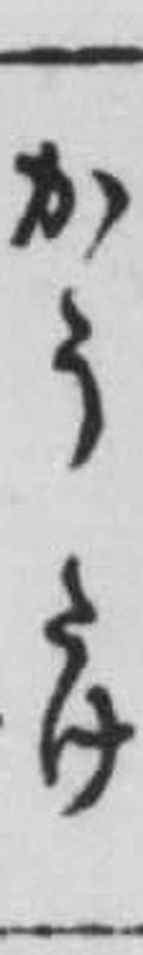かうたけ
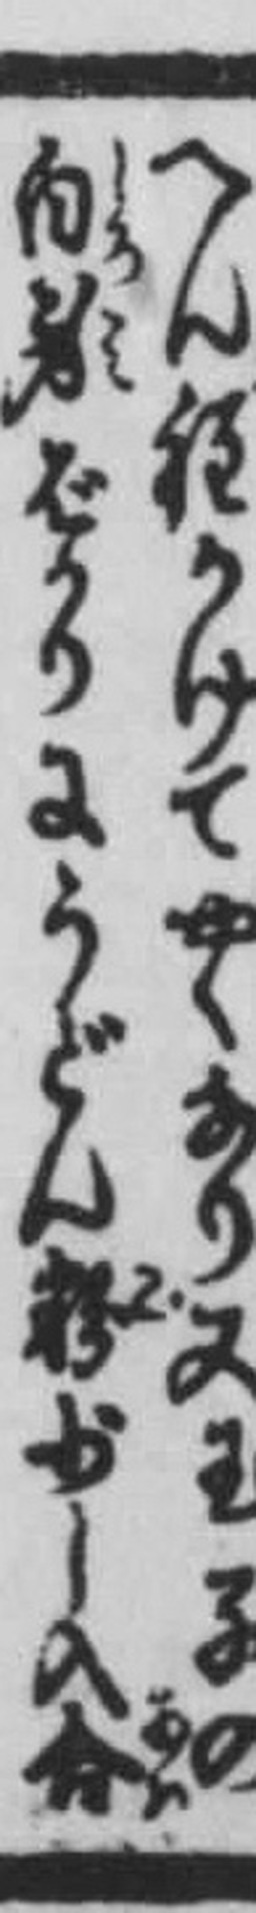白身ばかりにうどん粉少し入合
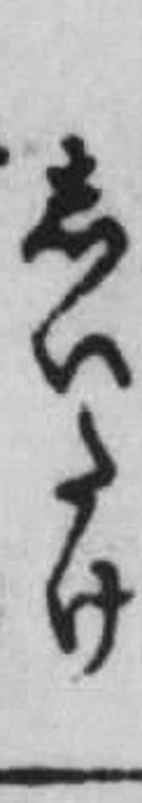しいたけ
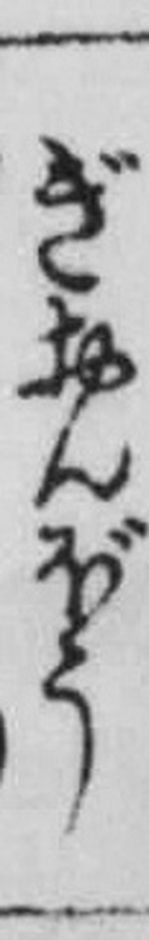ぎおんぼう
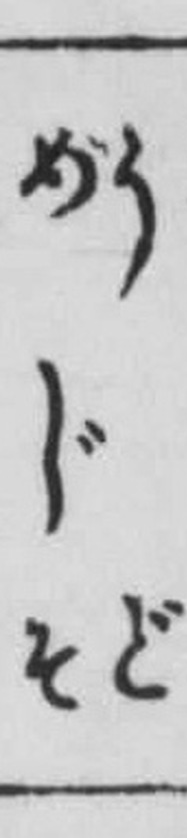めじそ
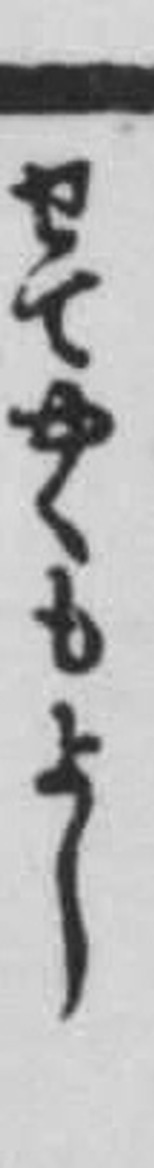せてやくもよし
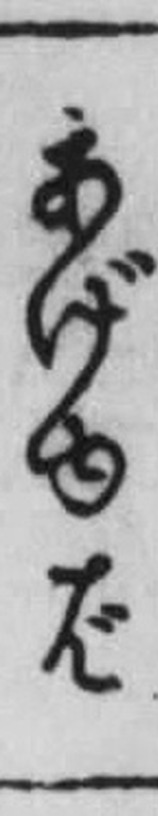あげゆば
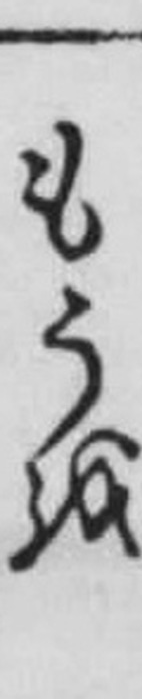もうを
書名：日用重宝魚類精進/料理早工風
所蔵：大阪府立大学学術情報センター 国文学研究資料館
